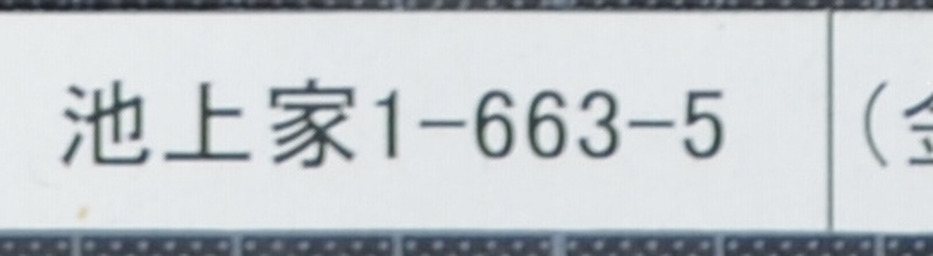池上様
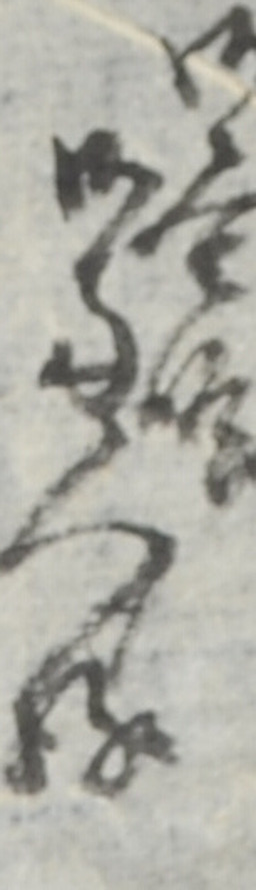御両人様
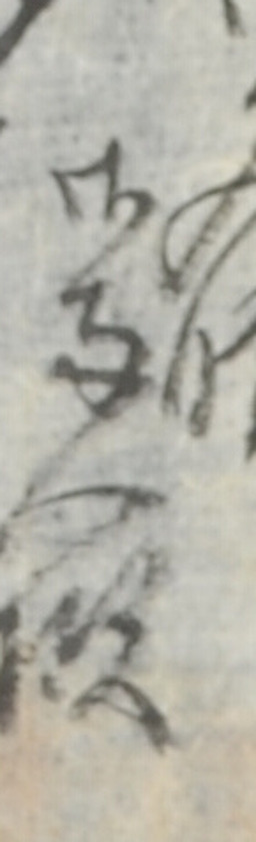御両人様
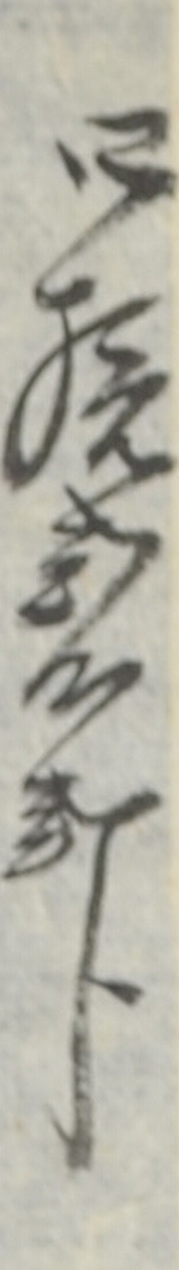四拾弐匁弐分
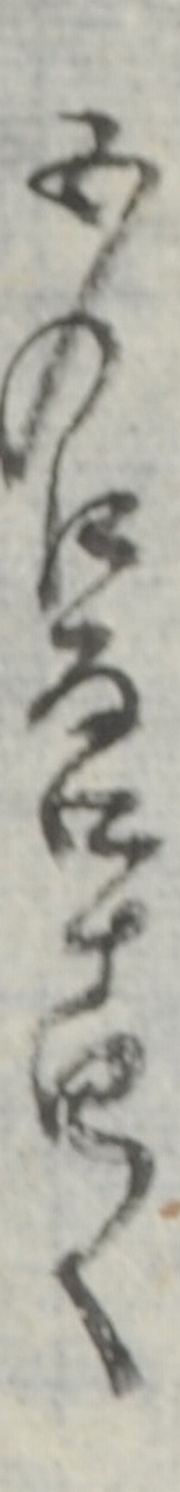五貫四百四十四文
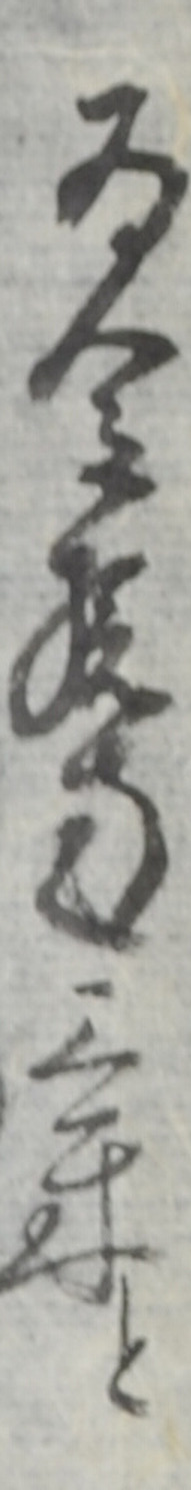為金拾両三朱と
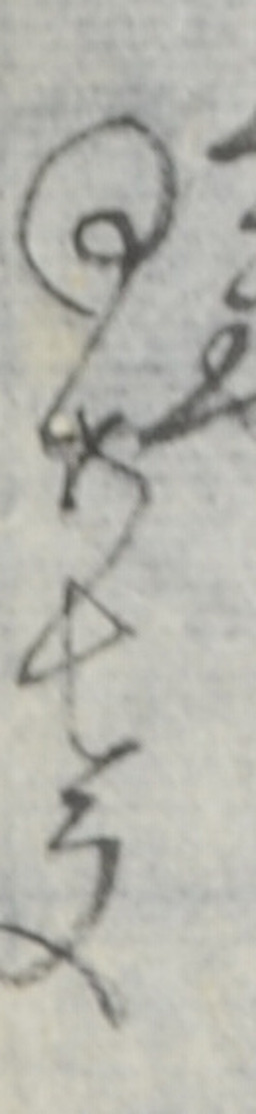百廿七文
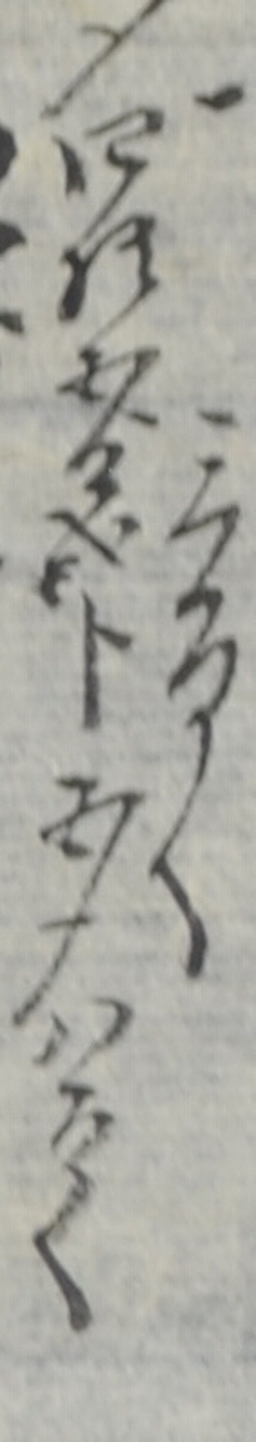〆四拾五匁弐分五貫八百文
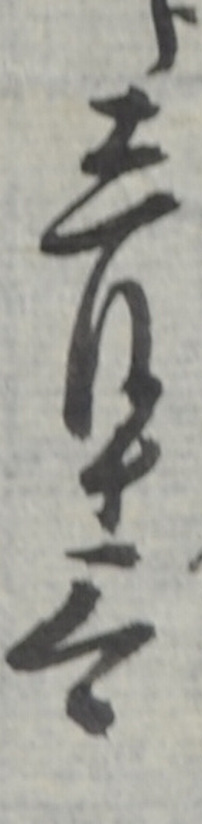十一月十日
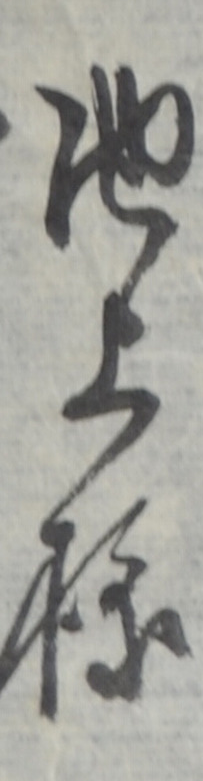池上様
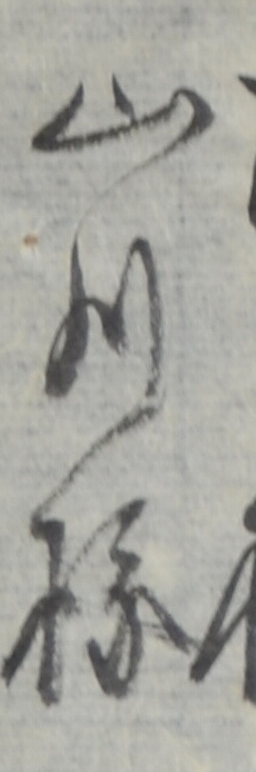山川様

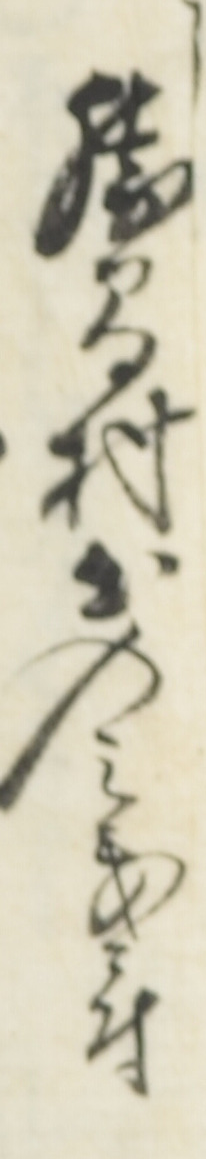勝間村出入之義二付
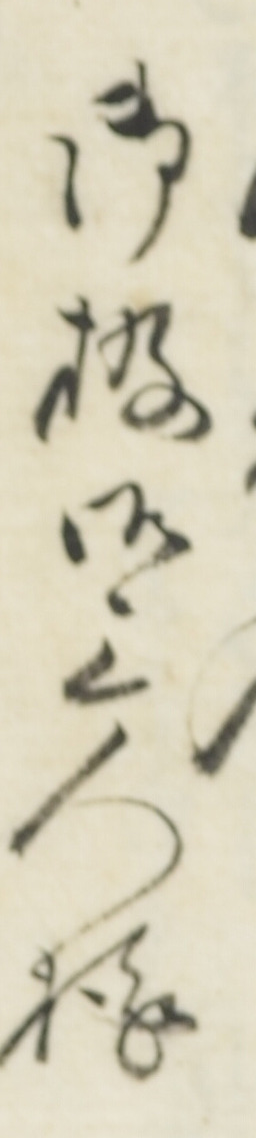御扱御三人様

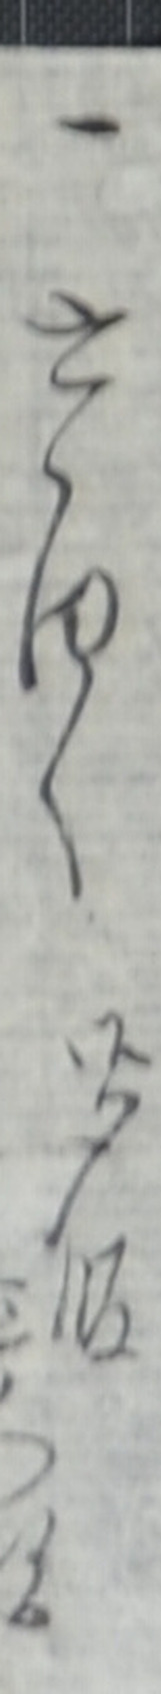一六百文御夕飯
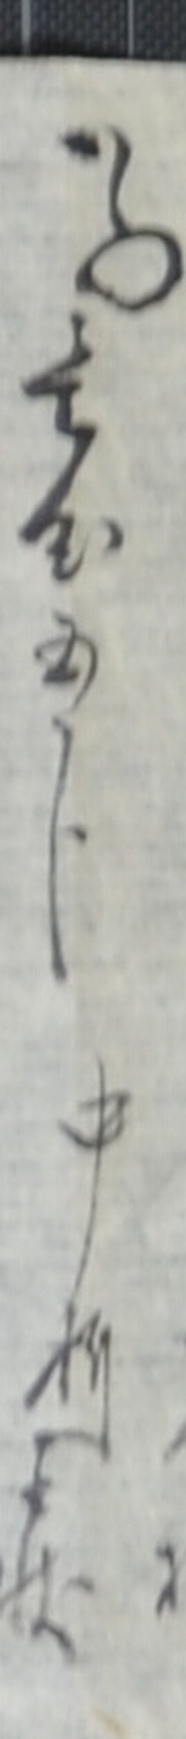一壱匁五分中折壱状
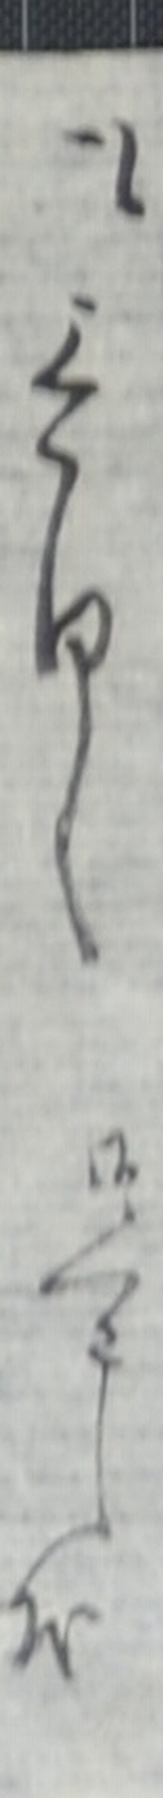一三百文御くわし代
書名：（金銭書上控）
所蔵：伊那市立高遠町図書館・合同会社AMANE
